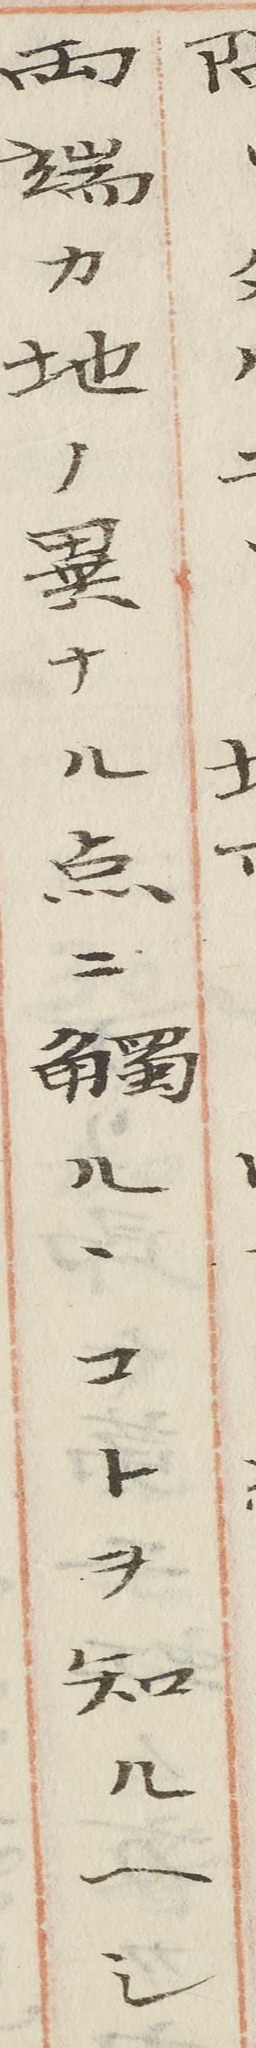両端カ地ノ異ナル点ニ触ルヽコトヲ知ルベシ
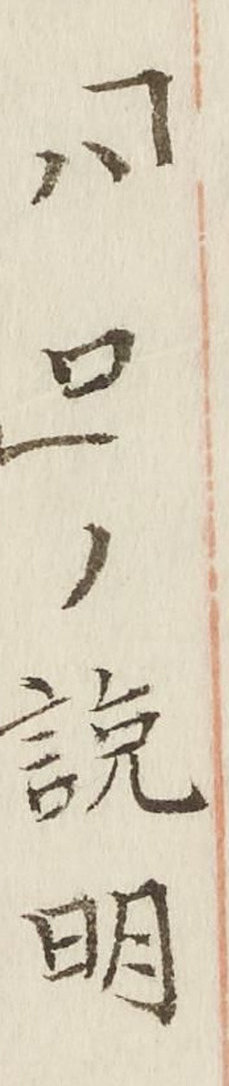「ハロ」ノ説明
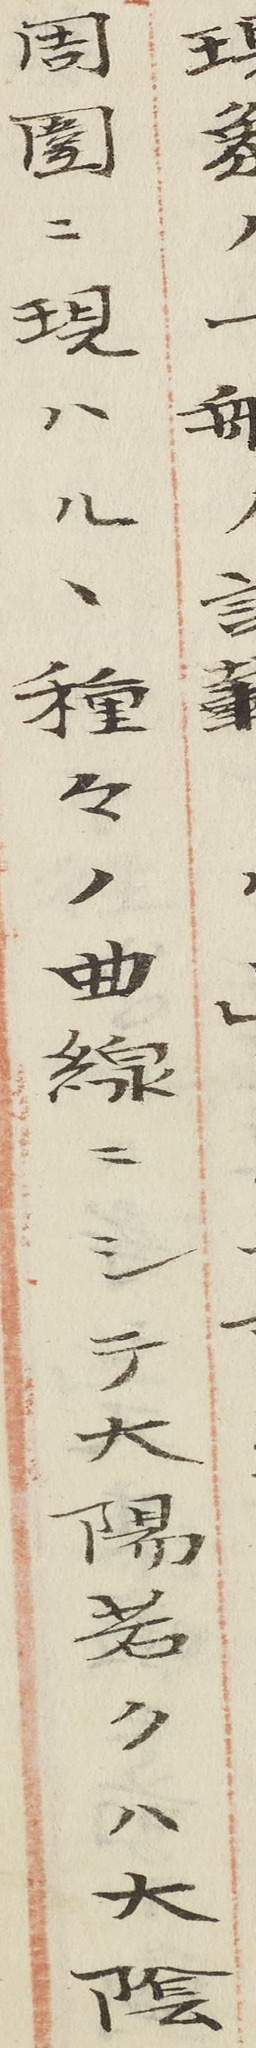周囲ニ現ハルヽ種々ノ曲線ニシテ大陽若クハ大陰
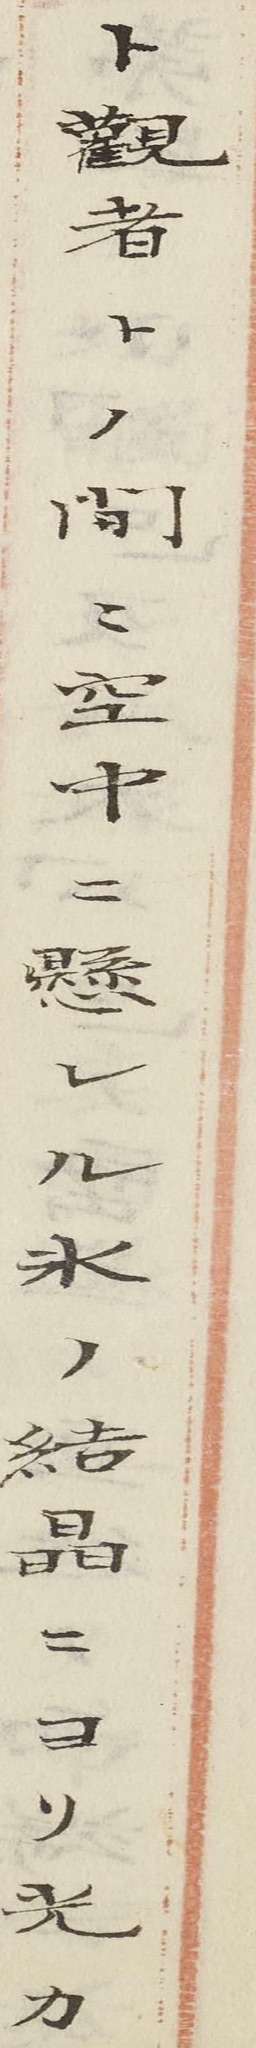ト観者トノ間ニ空中ニ懸レル氷ノ結晶ニヨリ光カ
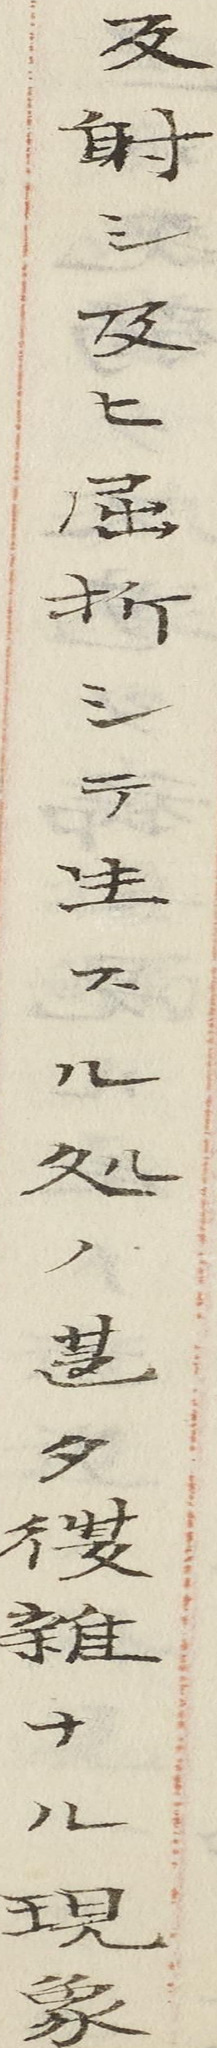反射シ及ヒ屈折シテ生スル処ノ甚タ復雑ナル現象
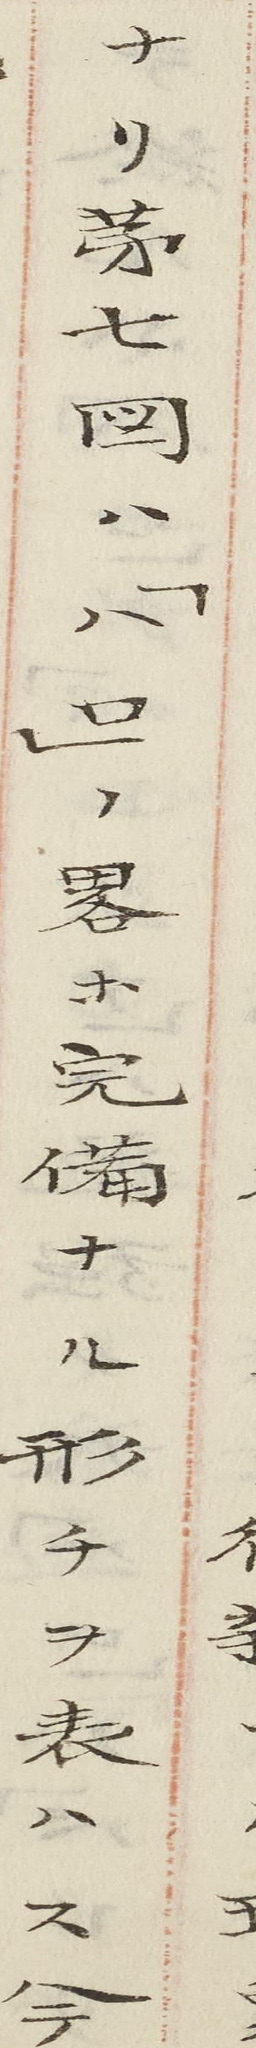ナリ第七図ハ「ハロ」ノ略ホ完備ナル形チヲ表ハス今
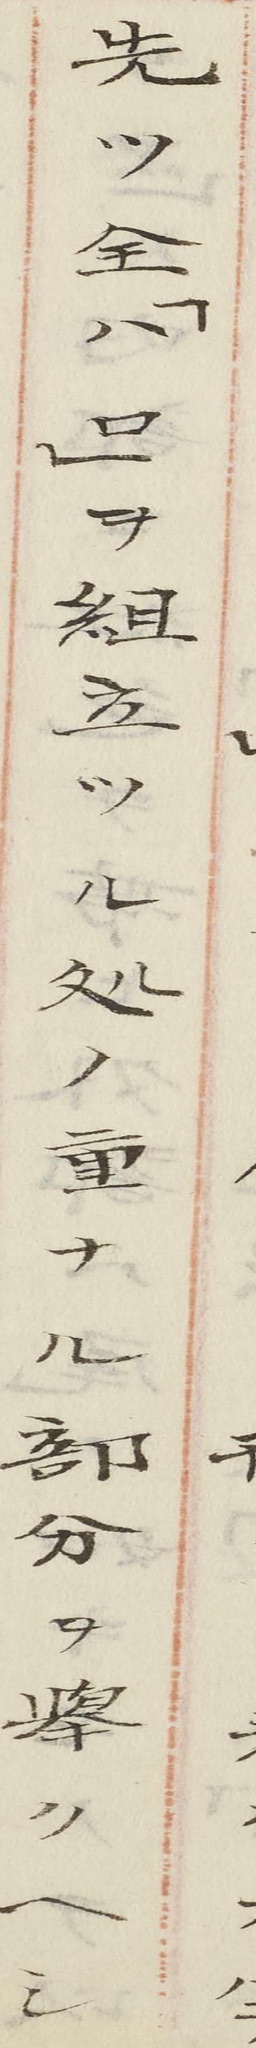先ツ全「ハロ」ヲ組立ツル処ノ重ナル部分ヲ挙クヘシ
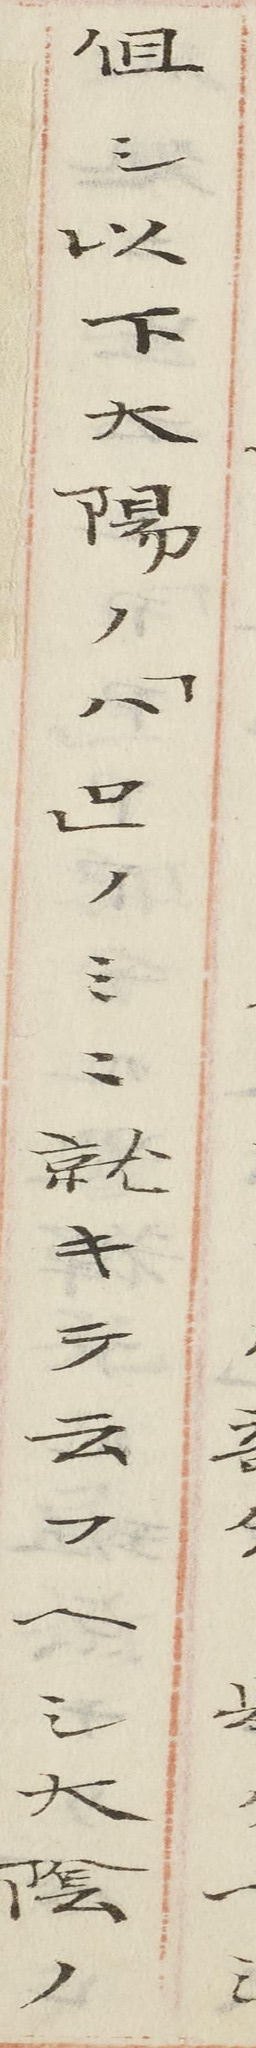但シ以下大陽ノ「ハロ」ノミニ就キテ云フヘシ大陰ノ
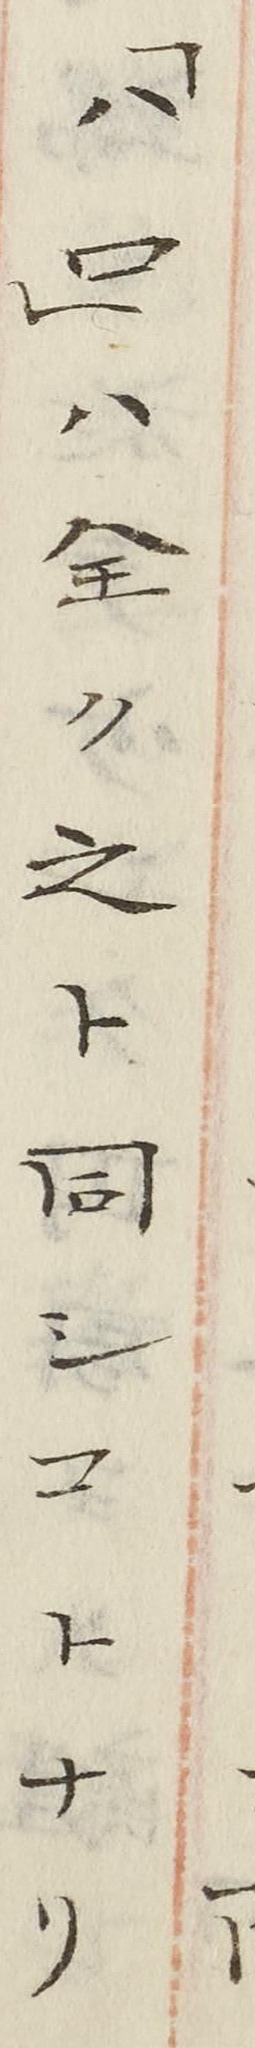「ハロ」ハ全ク之ト同シコトナリ
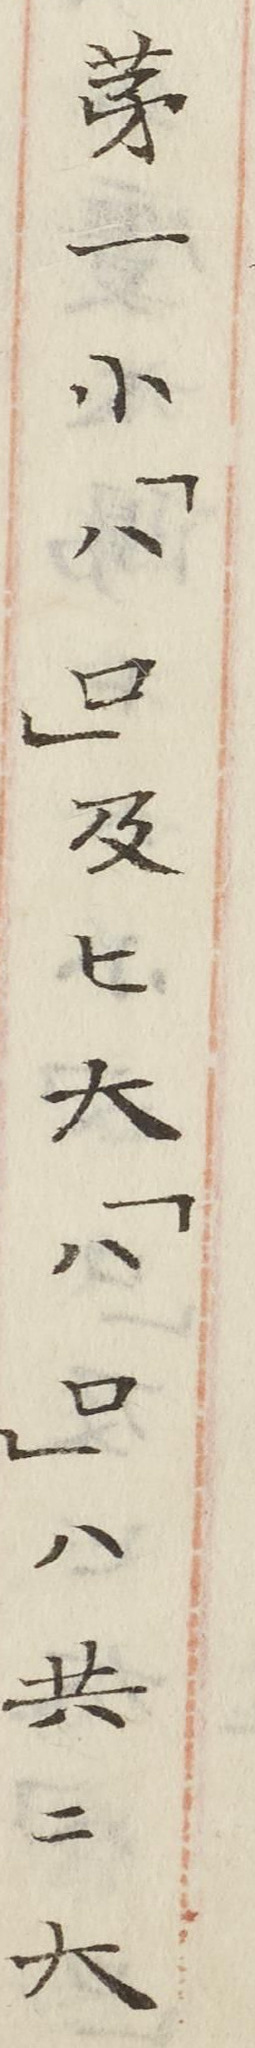第第一小「ハロ」及ヒ大「ハロ」ハ共ニ大
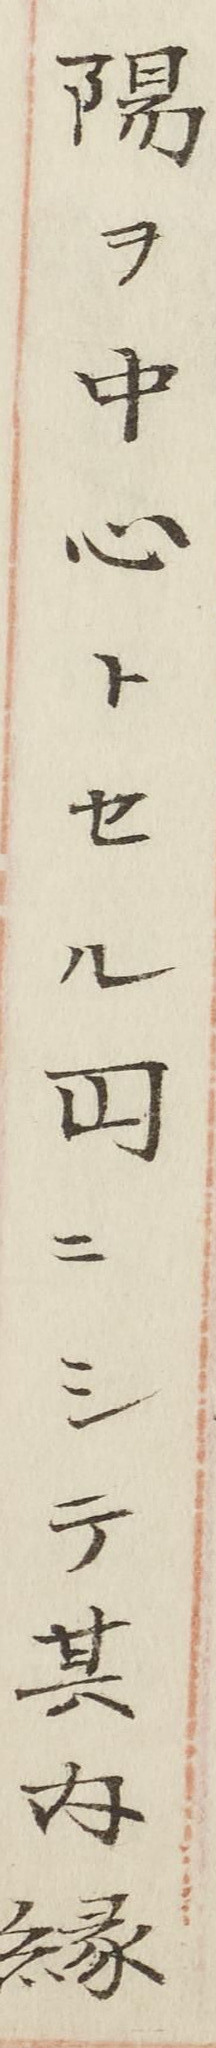陽ヲ中心トセル円ニシテ其内縁
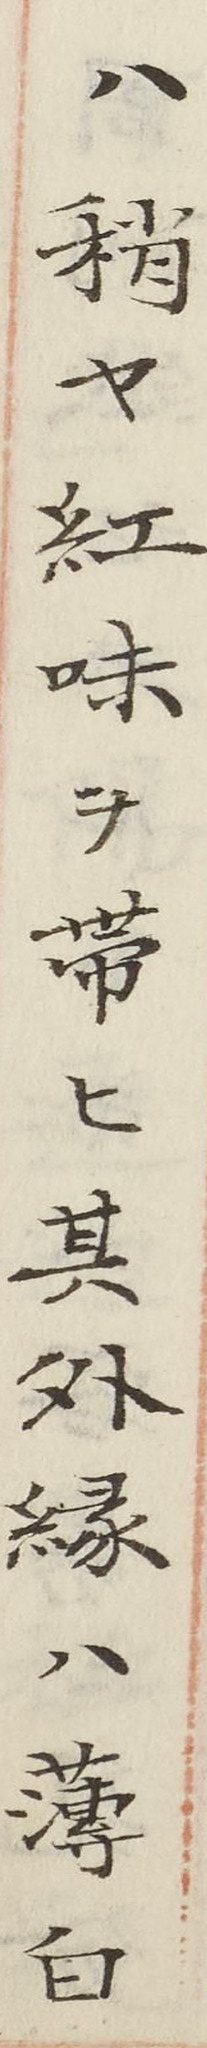七ハ稍ヤ紅味ヲ帯ヒ其外縁ハ薄白
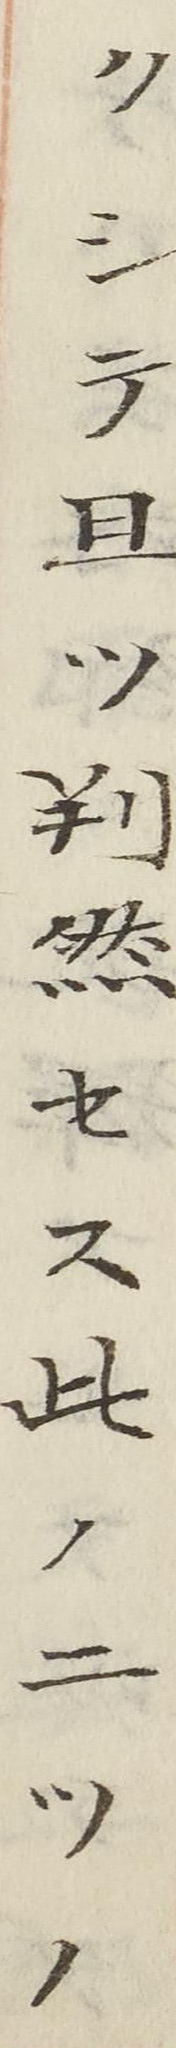クシテ且ツ判然セス此ノ二ツノ
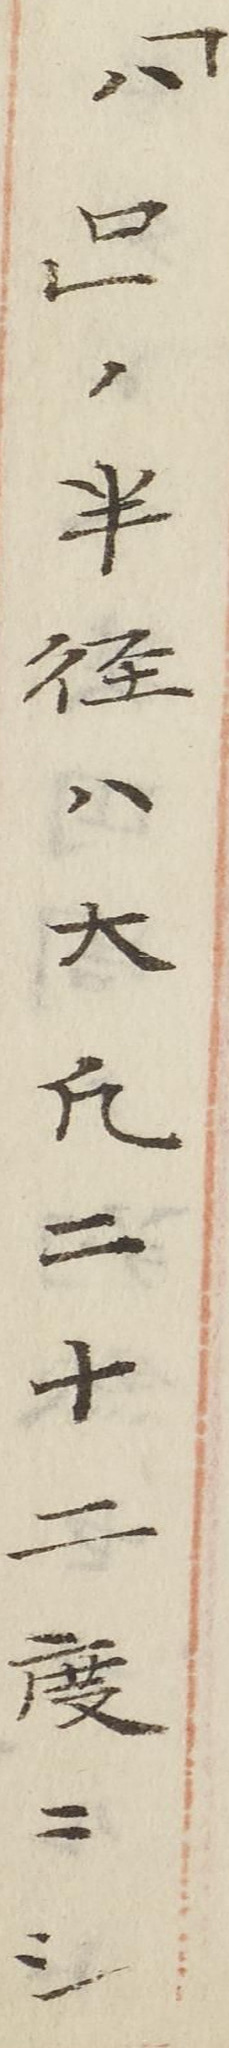「ハロ」ノ半径ハ大凡二十二度ニシ
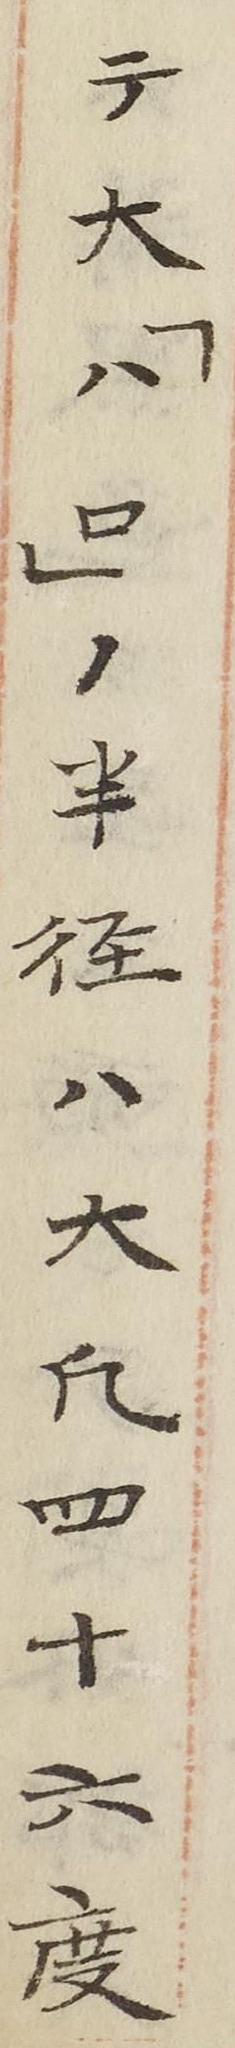テ大「ハロ」ノ半径ハ大凡四十六度

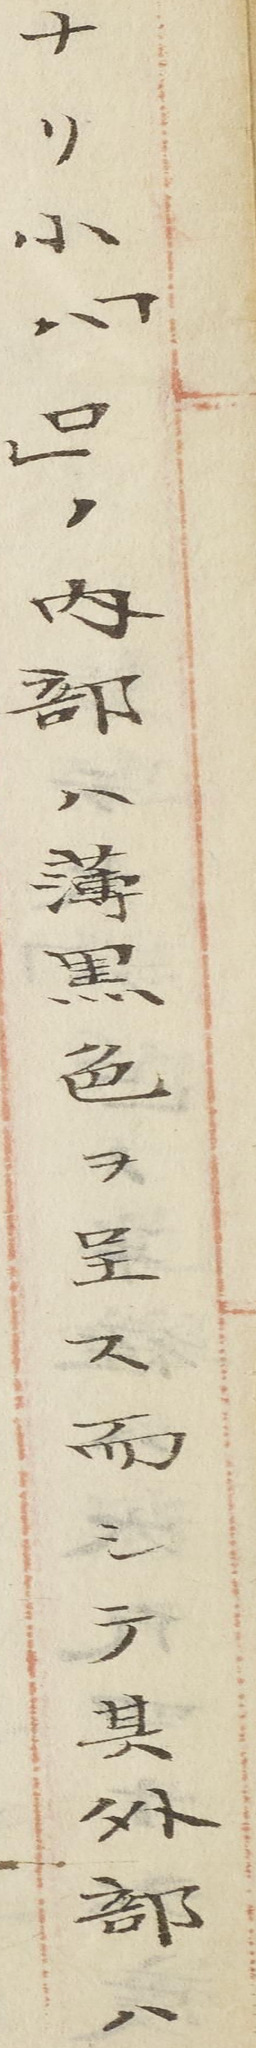ナリ小「ハロ」ノ内部ハ薄黒色ヲ呈ス而シテ其外部ハ
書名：虹及ハロノ説明
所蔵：東京大学地震研究所図書室 Earthquake Research Institute Library, The University of Tokyo, JAPAN
